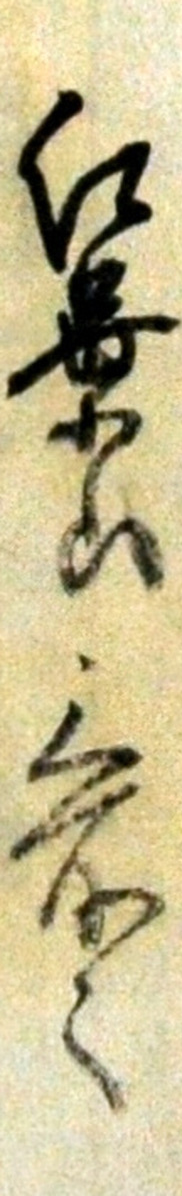紅葉山三所之
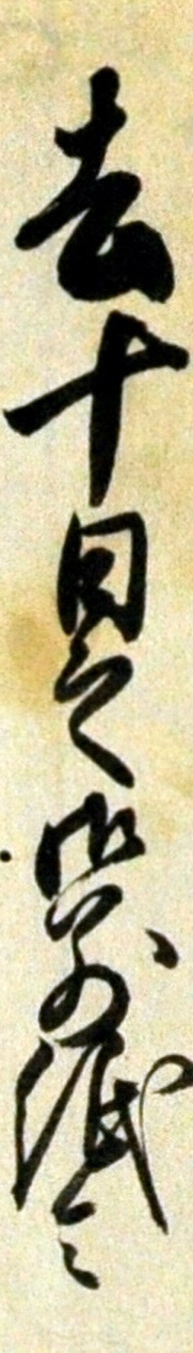去十日之御別紙令
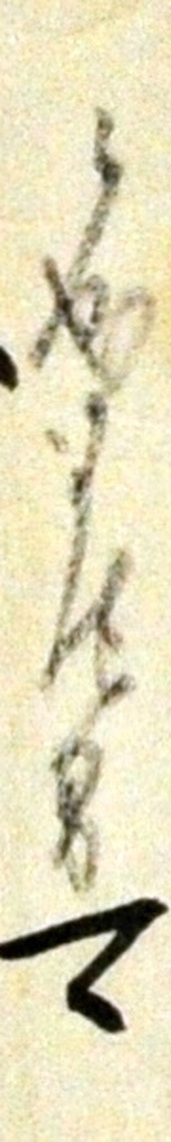被成御座間可
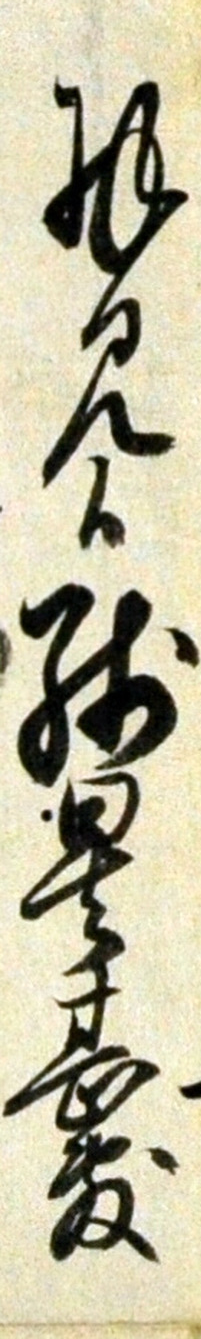拝見候残暑甚敷
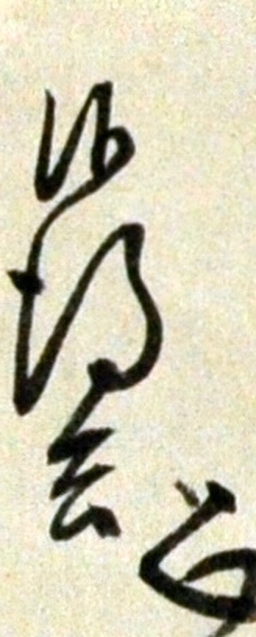候得共
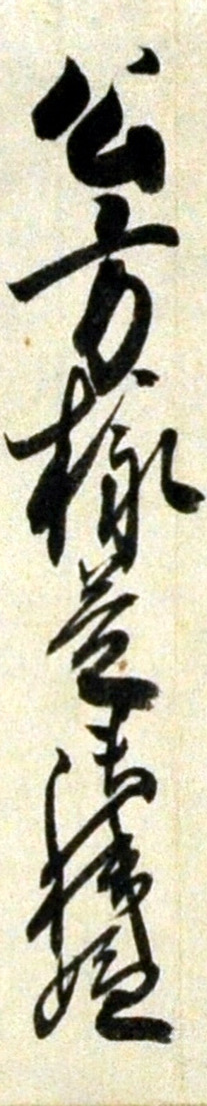公方様益御機嫌
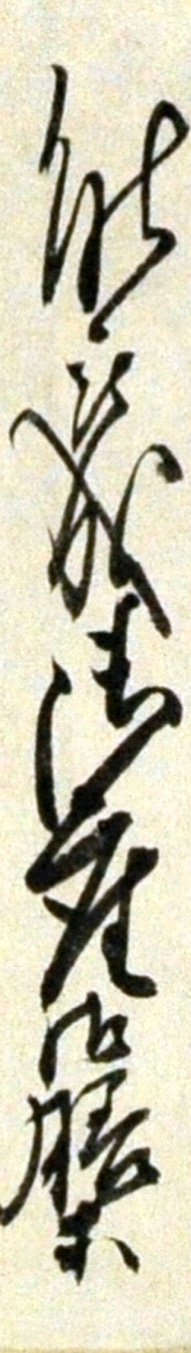能被成御座御膳等
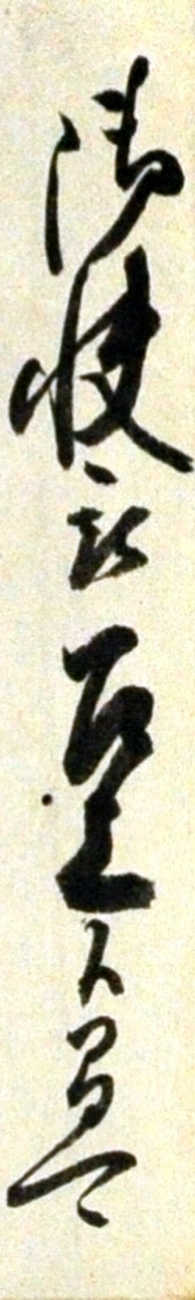御快被召上候間可
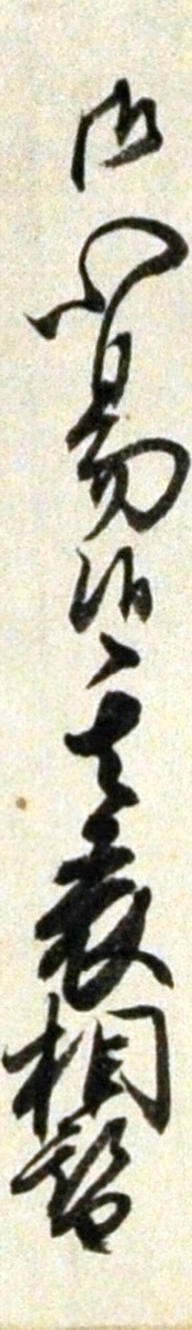御心易候其表相替
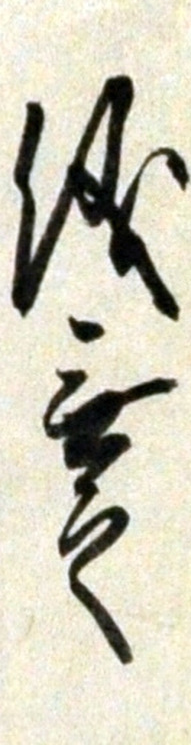儀無之
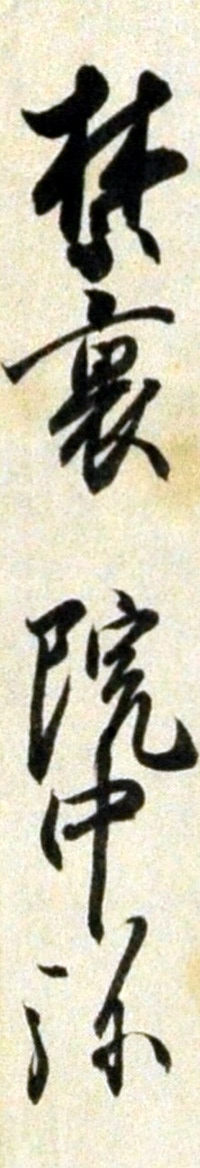禁裏院中弥
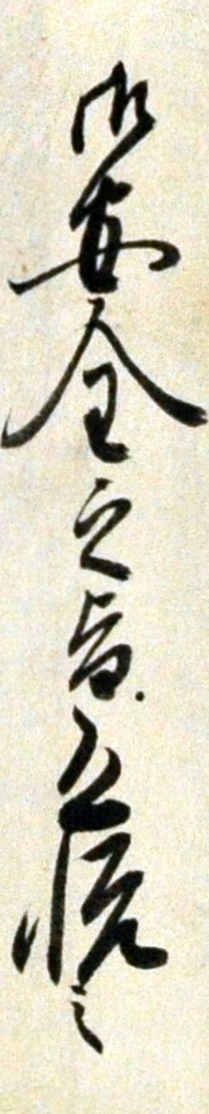御安全之旨恐悦之
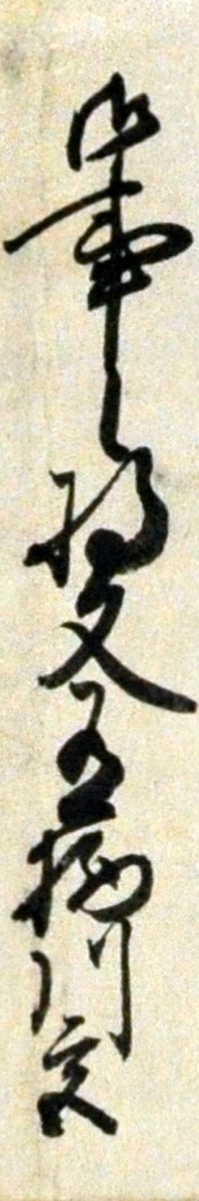御事候将又有栖川宮
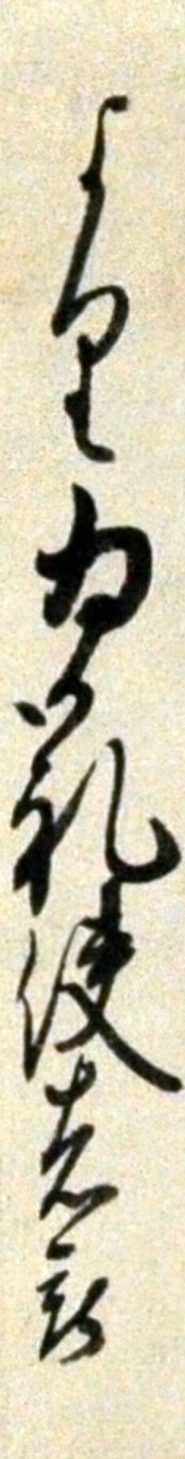より為御礼使者被
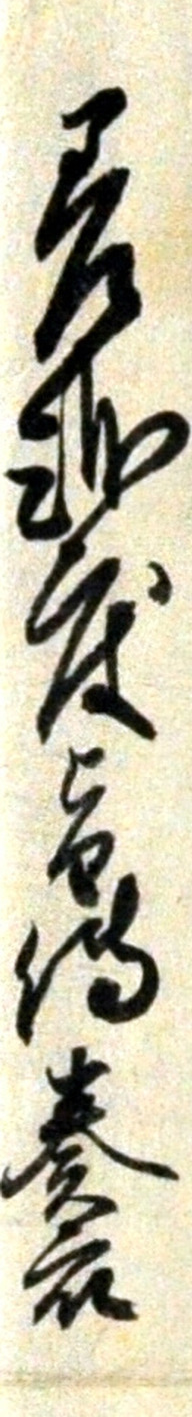差越度旨伝奏衆
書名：書状
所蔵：伊那市立高遠町図書館・合同会社AMANE
